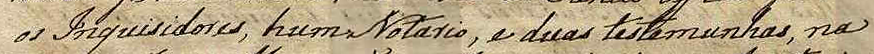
os Inquisidores, hum Notario, e duas testemunhas, na
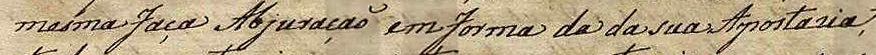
mesma faça Abjuraçaõ em forma da da sua Apostazia,
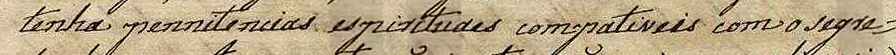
tenha pennitencias espirituaes compativeis com o segre
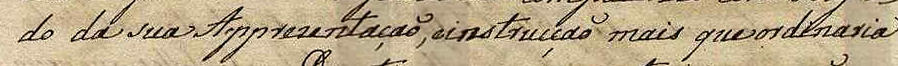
do da sua Apprezentaçaõ, e instrucçaõ mais que ordinaria
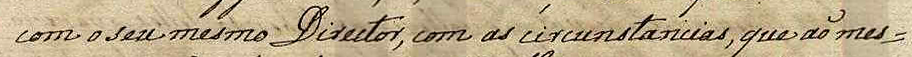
com o seu mesmo Director, com as circunstancias, que aõ mes
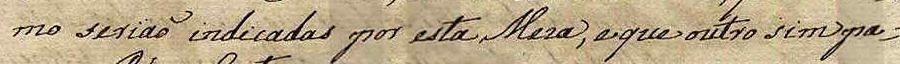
mo seriaõ indicadas por esta Meza, e que outrosim pa
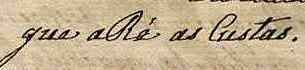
gue a Ré as Custas.
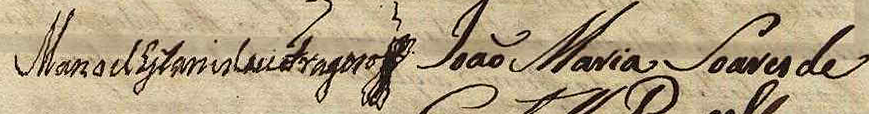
Manoel Estanislau Fragoso Ioaõ Maria Soares de
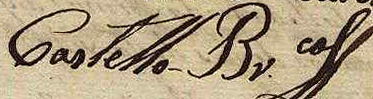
Castello Br.co
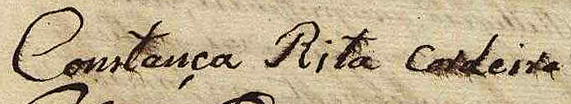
Constança Rita cordeira
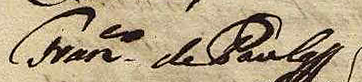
Fran.co de Paula
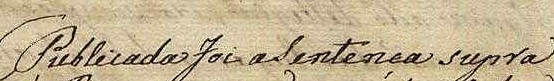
Publicada foi a sentença supra
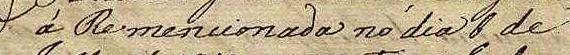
á Re mencionada no dia 6 de
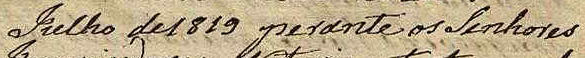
Iulho de 1819 perante os Senhores
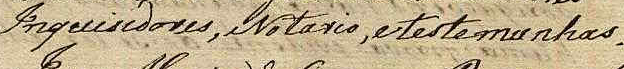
Inquisidores, Notario, e testemunhas.
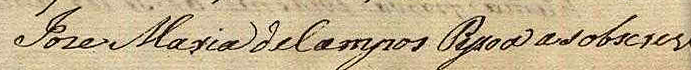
Ioze Maria de Campos Pessoa a sobscrev
